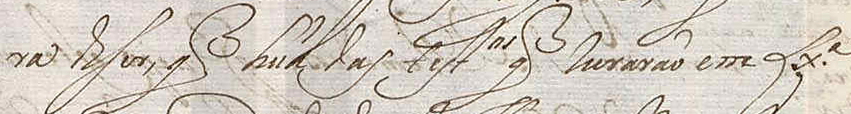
ra diser, q̄ hua das testas q̄ Iuraraõ em Lx.a
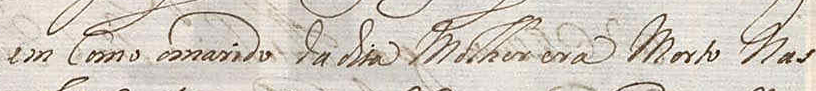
em Como o marido da dita Molher era Morto Nas
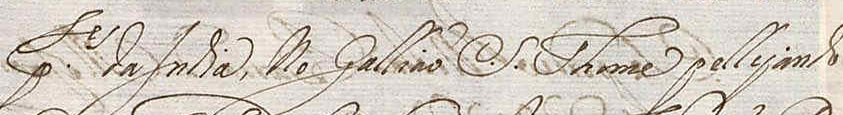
p.tes da Jndia, No Gallião S. Thome pellejando
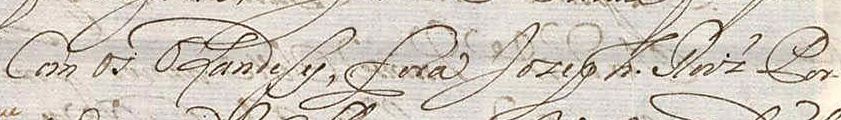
Com os OLandeses, fora Jozeph Roiz̄ Por
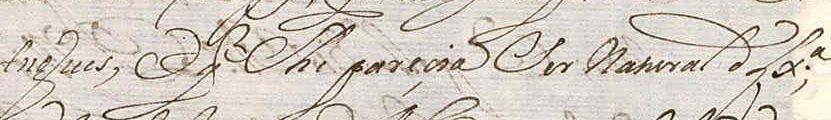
tugues, & q̄ lhe pareçia Ser Natural d̄ Lx;a
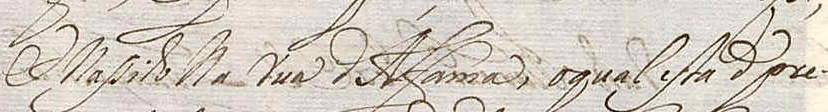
& Nassido Na rua d̄ Alfama, o qual esta d̄ pre
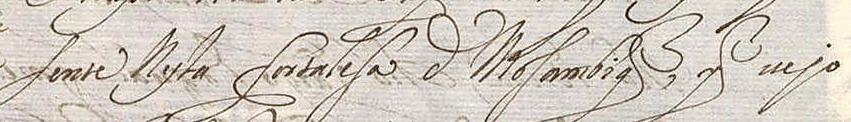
sente Nesta fortalesa d̄ Mosambiq̄, q̄ uejo
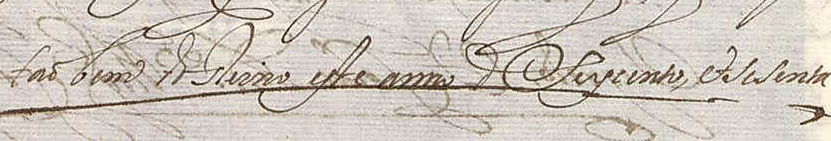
taõbem do Reino este anno d̄ Seiscento, & sesenta
